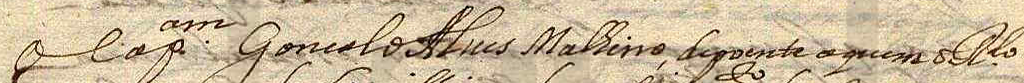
O Cap.am Gonçalo Alues Malheiro, depoente a quem o R.do
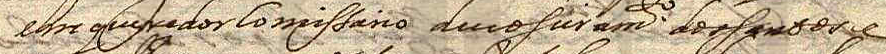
emqueredor Comissario deu o juramto. dos santos e
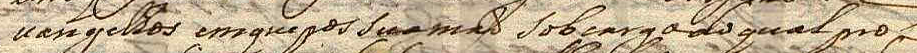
uangelhos em que pos sua maõ sob cargo do qual pro
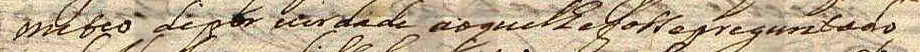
meteo de por uerdade ao que lhe fosse preguntado,
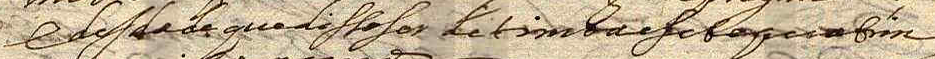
e de Jdade que disse ser de trinta e sete pera trin
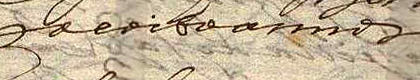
ta e oito annos
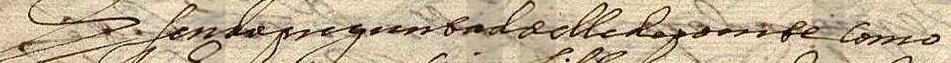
E sendo preguntado elle depoente como
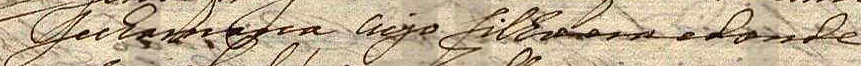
se chamaua, cujo filho era e donde
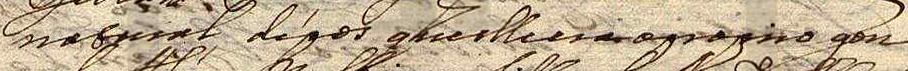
natural depos que elle era o proprio gon
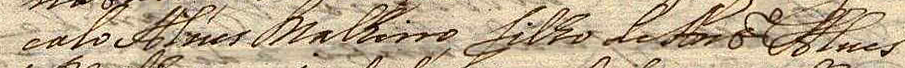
çalo Alues Malheiro, filho de Anto Alues
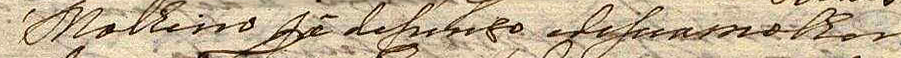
Malheiro Já defunto e de sua molher
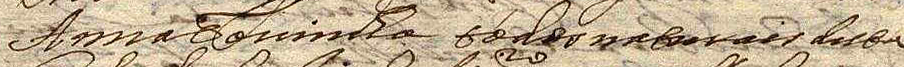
Anna Touinha todos naturais desta
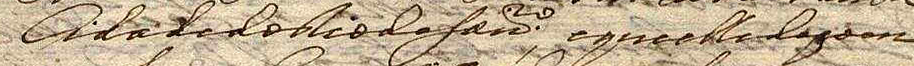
Cidade do Rio de Jan.ro, e que elle depoen
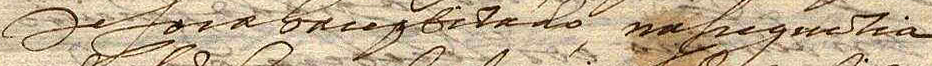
te fora bauptizado na freguezia
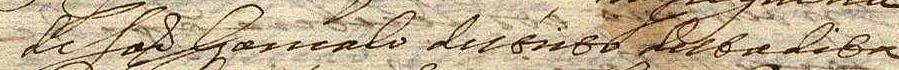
de saõ Gonçalo distrito desta dita
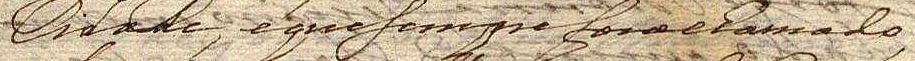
Cidade, e que sempre fora chamado,
